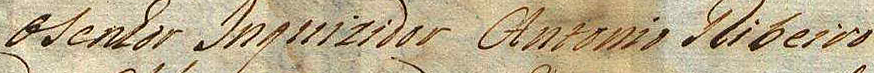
o senhor Inquizidor Antonio Ribeiro
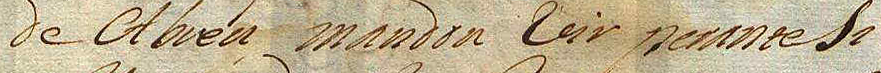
de Abreu, mandou vir perante Si
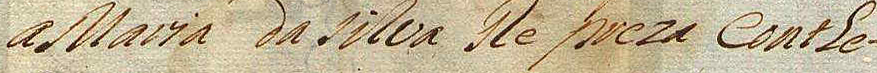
a Maria da silva Re preza conthe
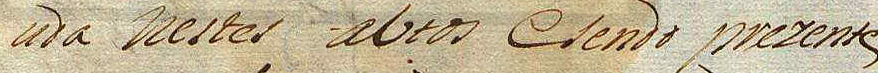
uda nestes avtos e sendo prezente
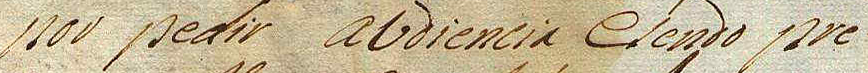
por pedir avdiencia e sendo pre
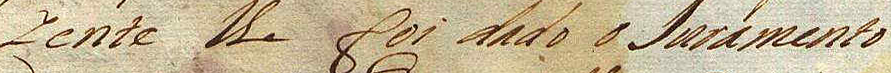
zente lhe foi dado o Iuramento
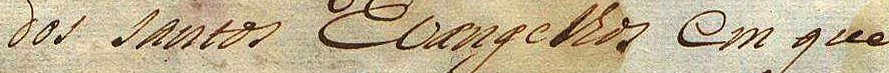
dos santos Evangelhos em que
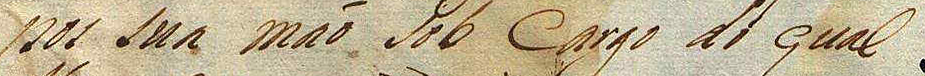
pos sua maõ sob cargo do qual
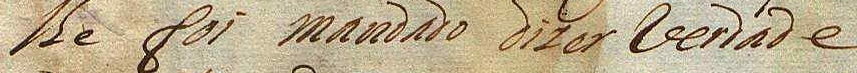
lhe foi mandado dizer verdade
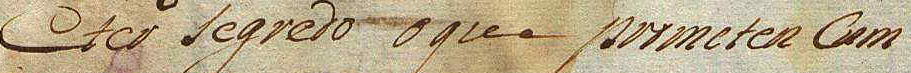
e ter segredo o que prometeu cum
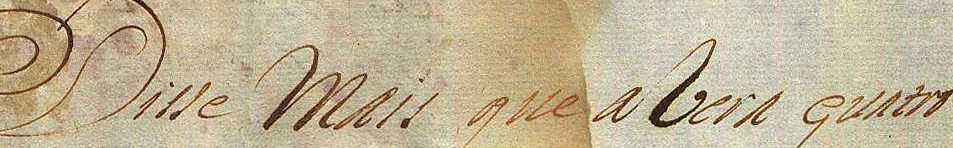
Disse Mais que aVera quatro
